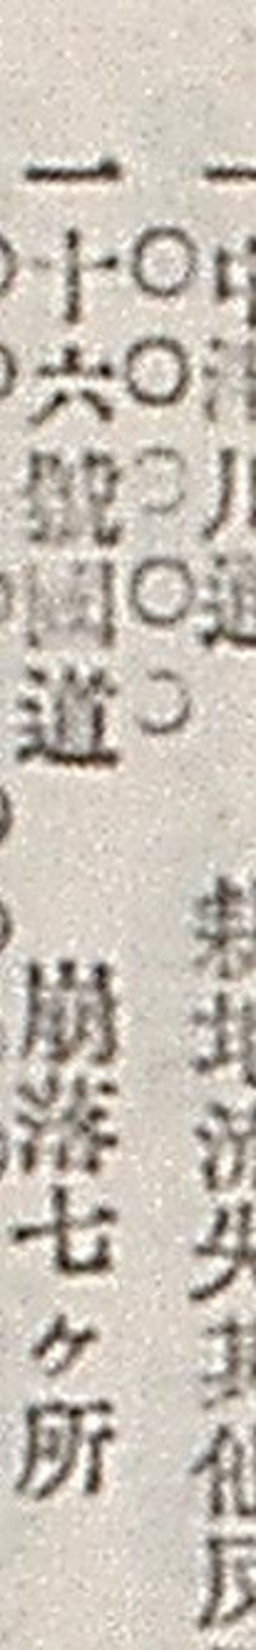一十六号国道崩落七ヶ所
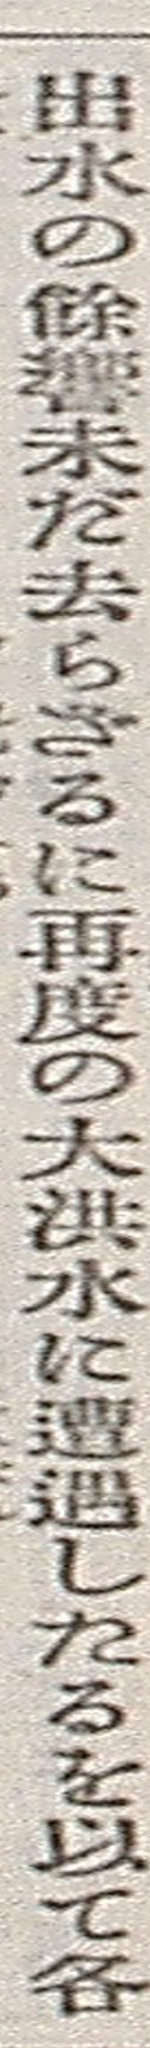出水の餘響未だ去らざるに再度の大洪水に遭遇したるを以て各
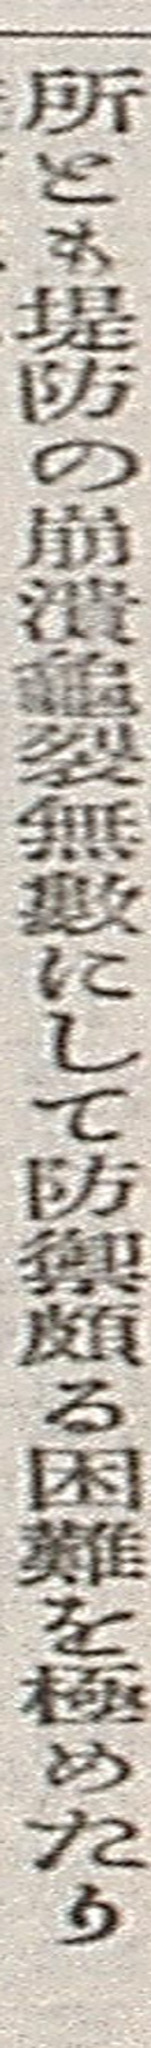所とも堤防の崩潰亀裂無数にして防禦頗る困難を極めたり
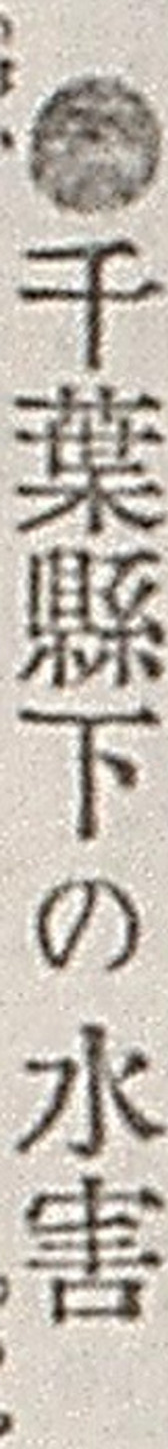●千葉県下の水害
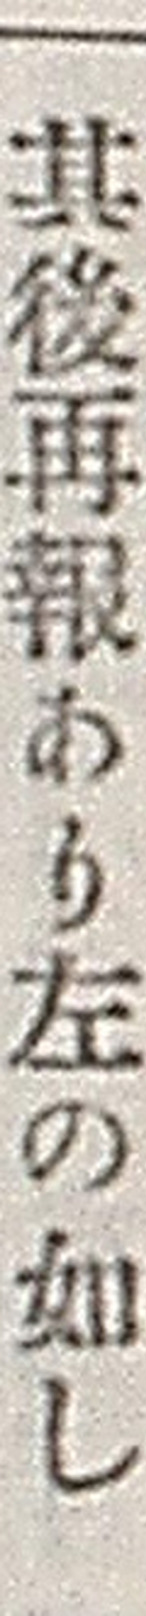其後再報あり左の如し
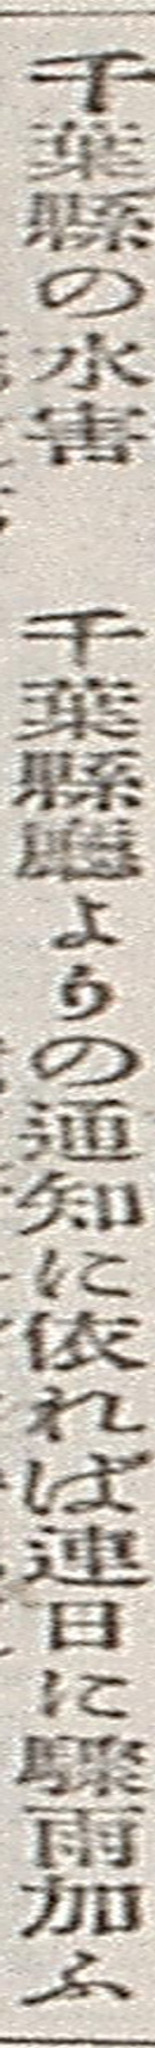千葉県の水害千葉県廰よりの通知に依れば連日に驟雨加ふ
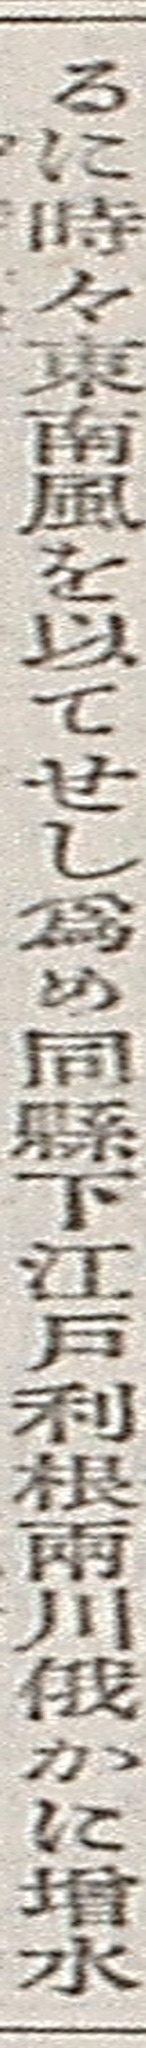るに時々東南風を以てせし為め同県下江戸利根両川俄かに増水
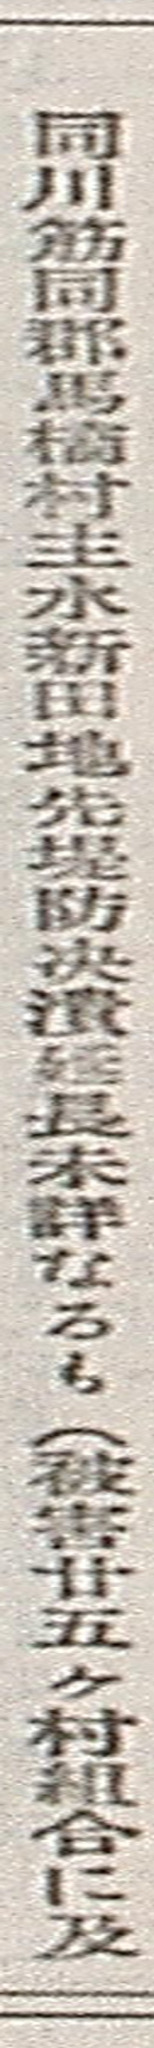同川筋同郡馬橋村主水新田地先堤防决潰れ延長未詳なるも（被害廿五ヶ村組合に及
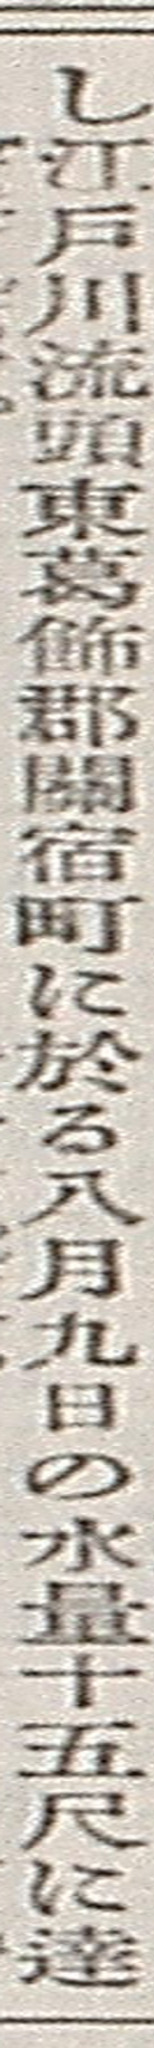し江戸川流頭東葛飾郡関宿町に於る八月九日の水量十五尺に達
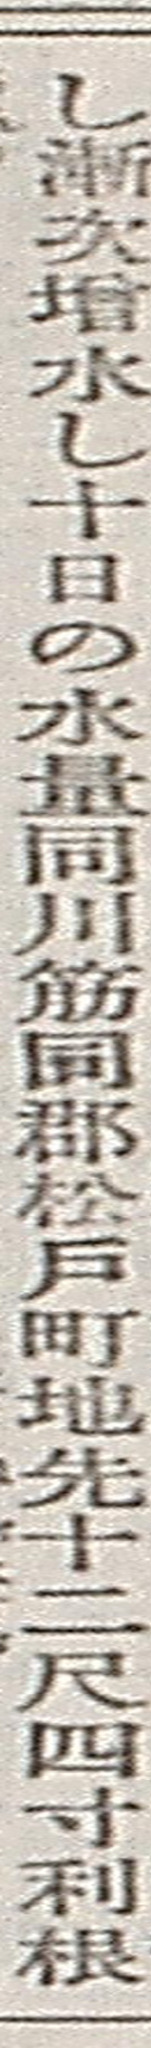し漸次増水し十日の水量同川筋同郡松戸町地先十二尺四寸利根
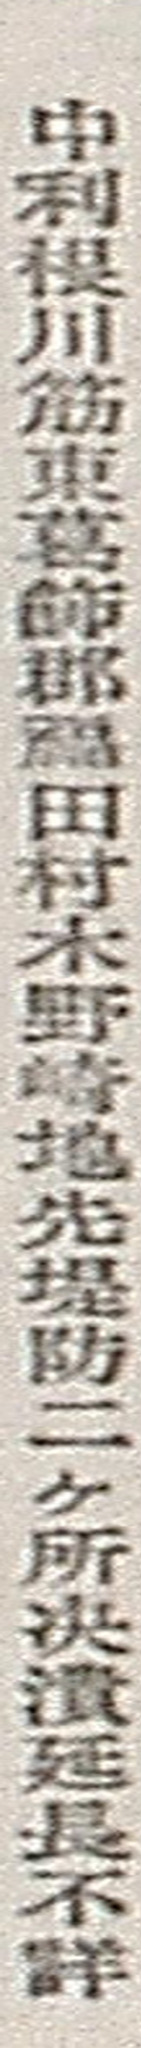中利根川筋東葛飾郡福田村木野崎地先堤防二ヶ所决潰延長不詳
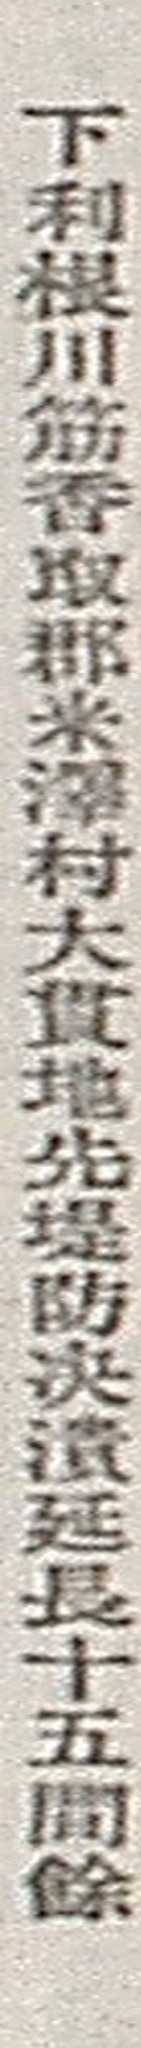下利根川筋香取郡米沢村大貫地先堤防决潰延長十五間餘
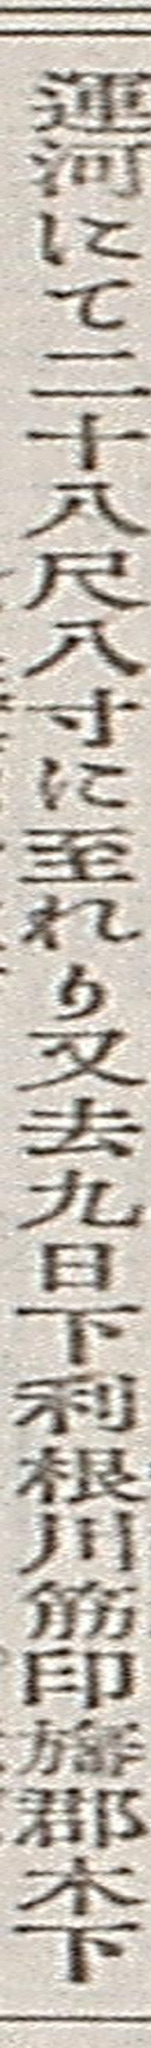運河にて二十八尺八寸に至れり又去九日下利根川筋印旛郡木下
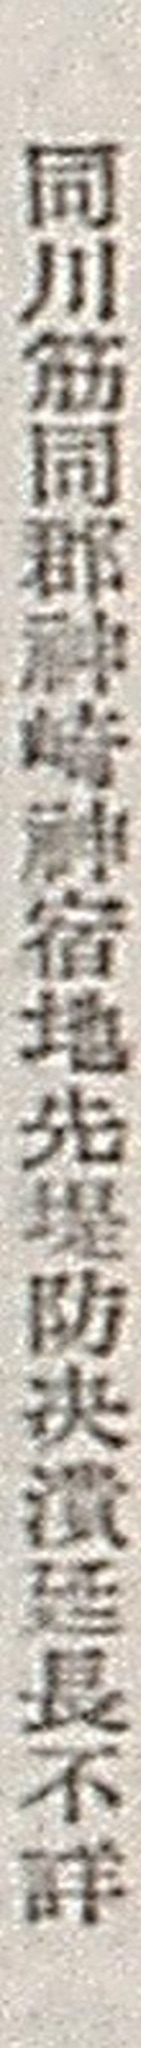同川筋同郡神崎神宿地先堤防决潰延長不詳
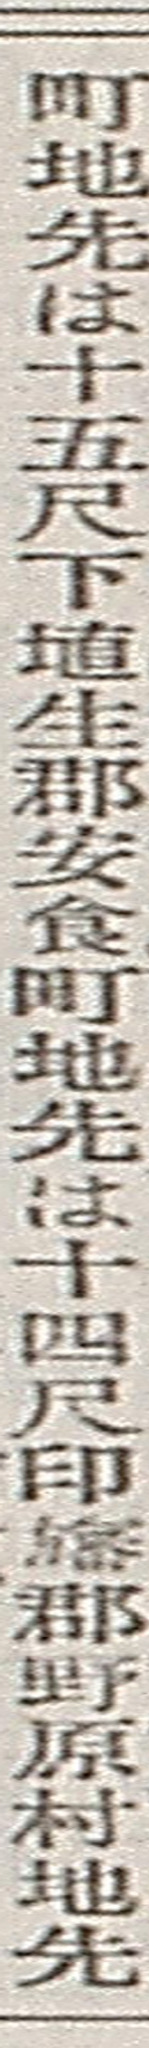町地先は十五尺下埴生郡安食町地先は十四尺印旛郡野原村地先
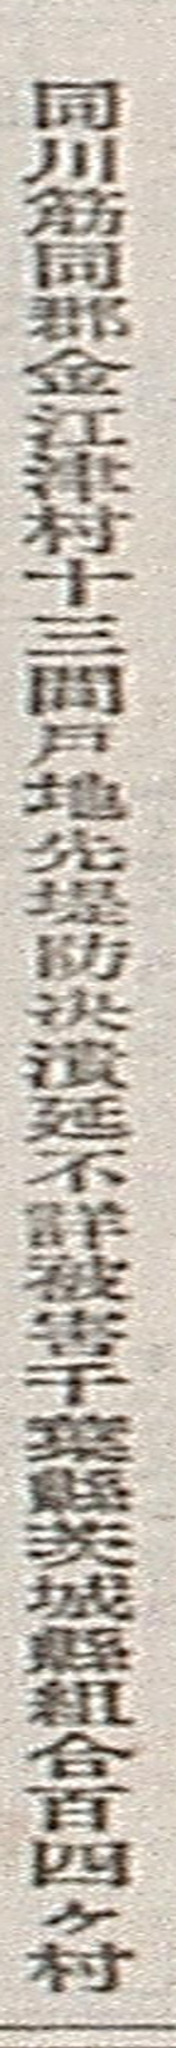同川筋同郡金江津村十三間戸地先堤防决潰延不詳被害千葉県茨城県組合百四ヶ村
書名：風俗畫報臨時増刊第百二十八號　洪水被害録（下）
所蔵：東京大学地震研究所図書室 Earthquake Research Institute Library, The University of Tokyo, JAPAN
